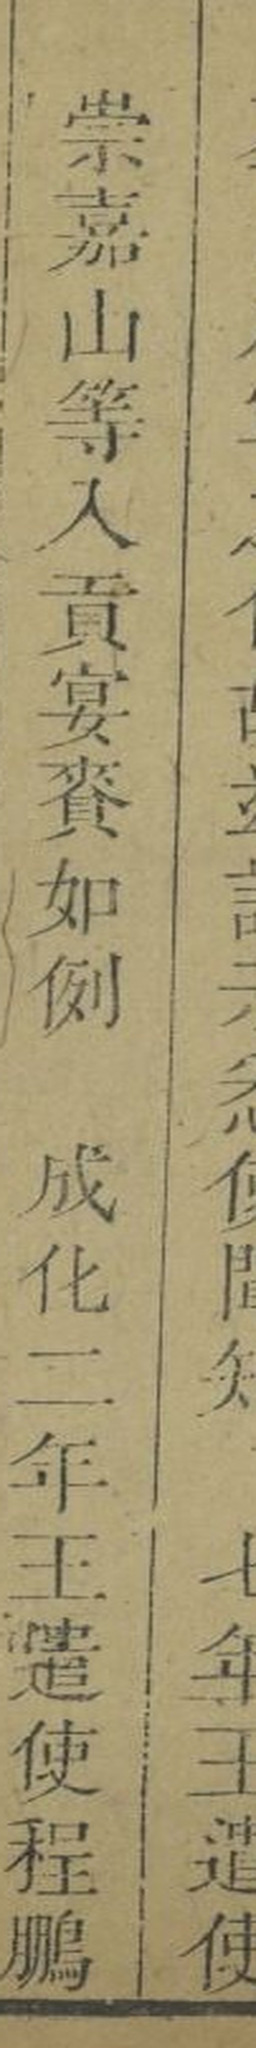崇嘉山等入貢宴賚如例成化二年王遣使程鵬
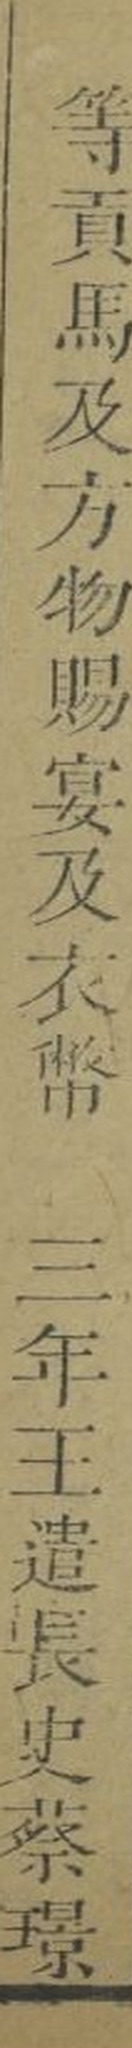等貢馬及方物賜宴及衣幣三年王遣長史蔡璟
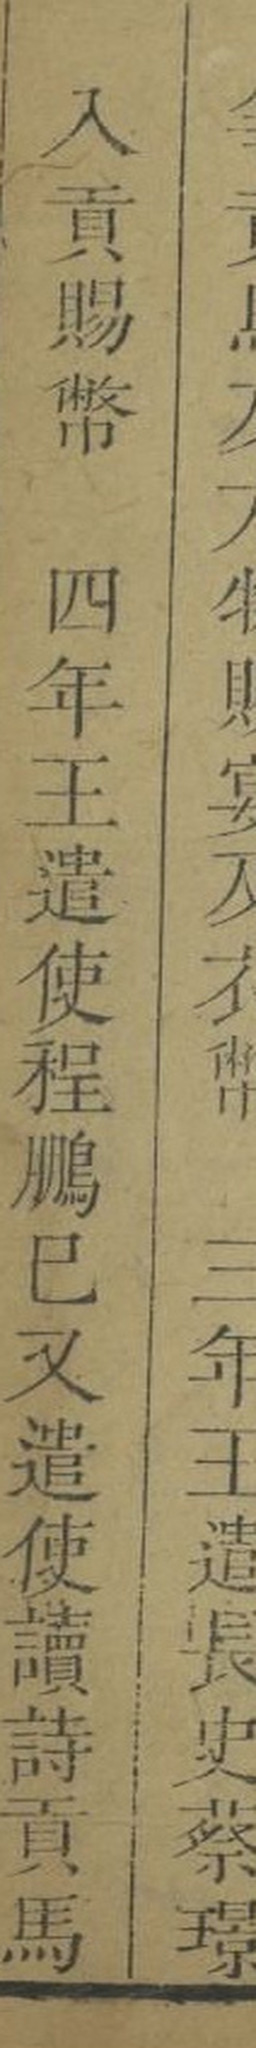入貢賜幣四年王遣使程鵬巳又遣使読詩貢馬

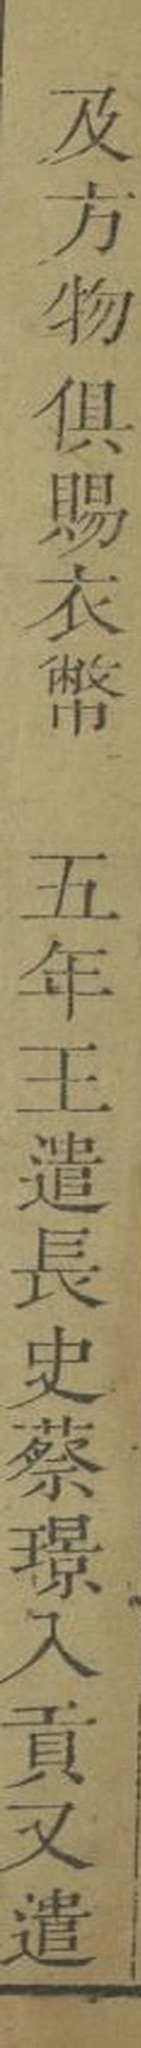及方物俱賜衣幣五年王遣長史蔡璟入貢又遣
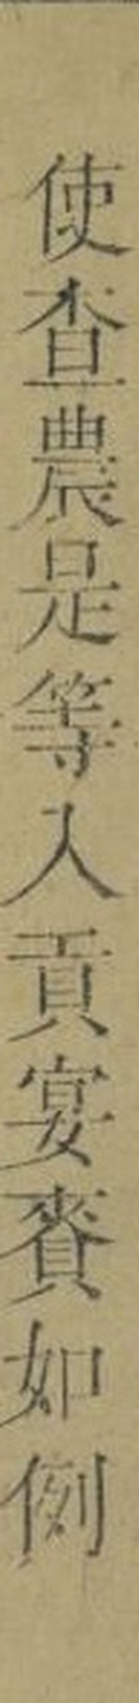使査農是等入貢宴賚如例
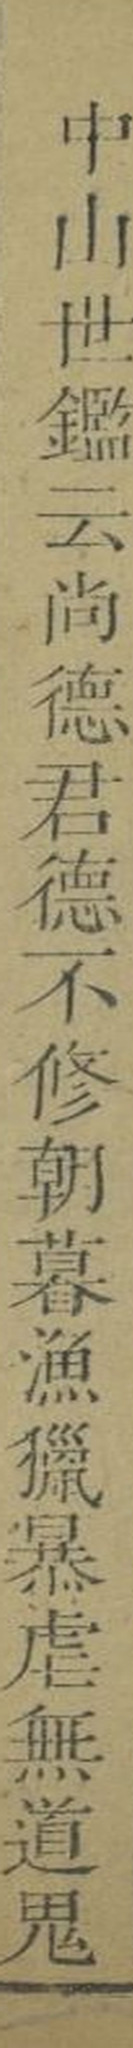中山世鑑云尚徳君徳不修朝暮漁猟暴虐無道鬼
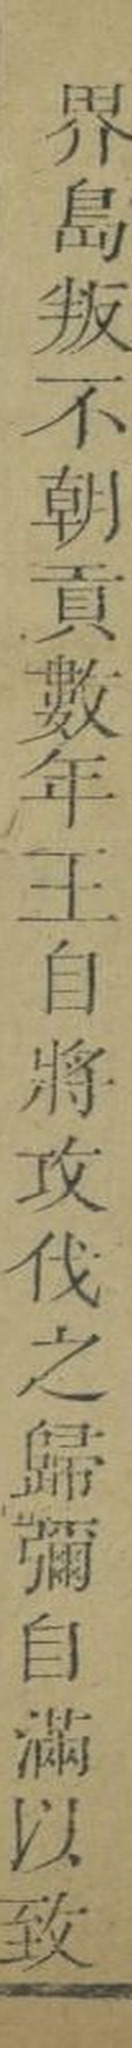界島叛不朝貢数年王自将攻伐之帰弥自満以致
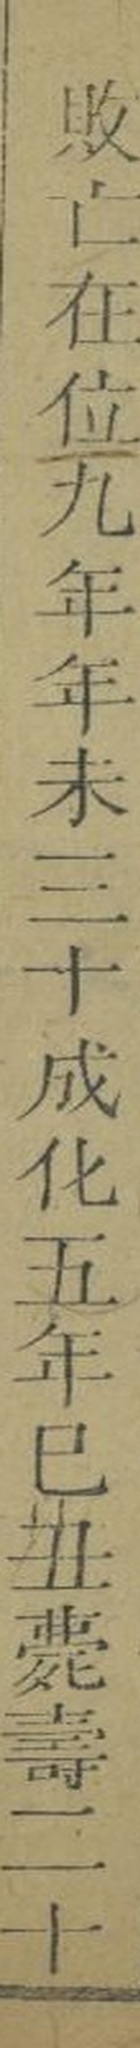敗亡在位九年年未三十成化五年巳丑薨寿二十
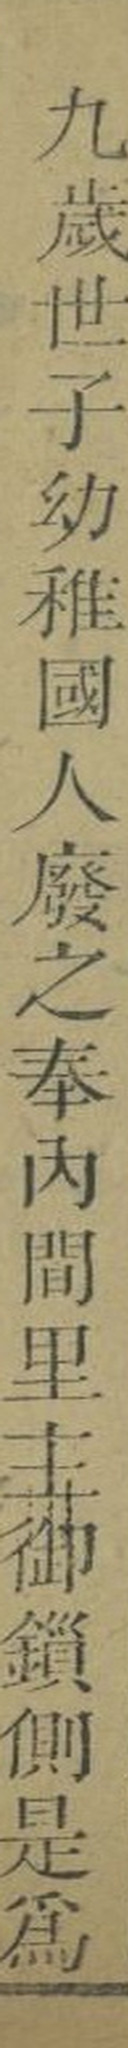九歳世子幼稚国人廃之奉内間里主御鎖側是為
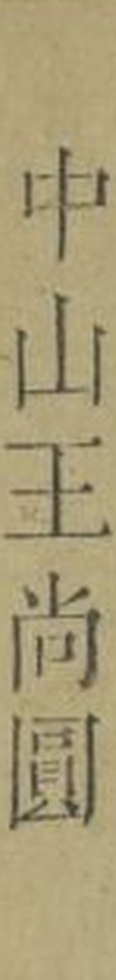中山王尚円
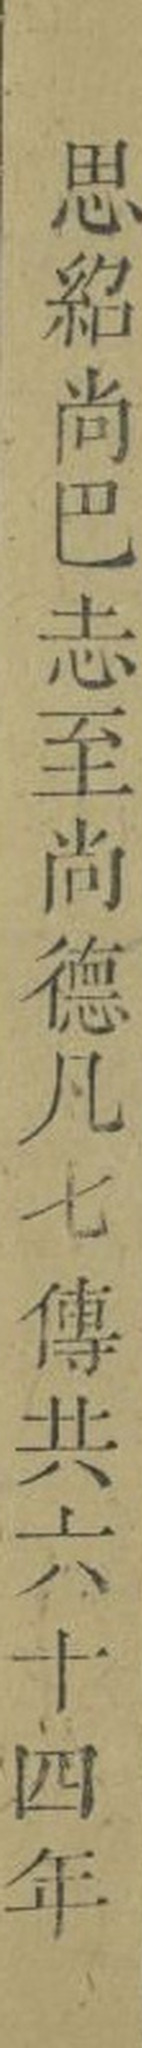思紹尚巴志至尚徳凡七伝共六十四年
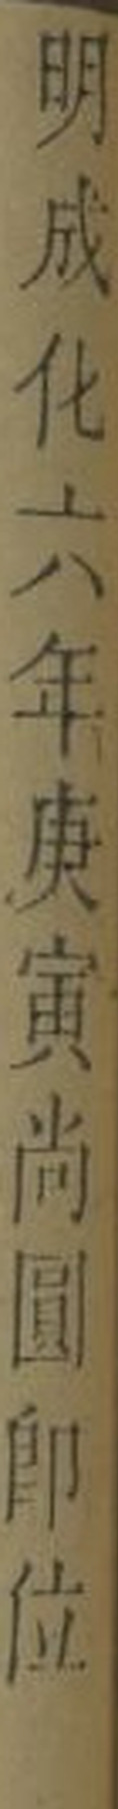明成化六年庚寅尚円即位
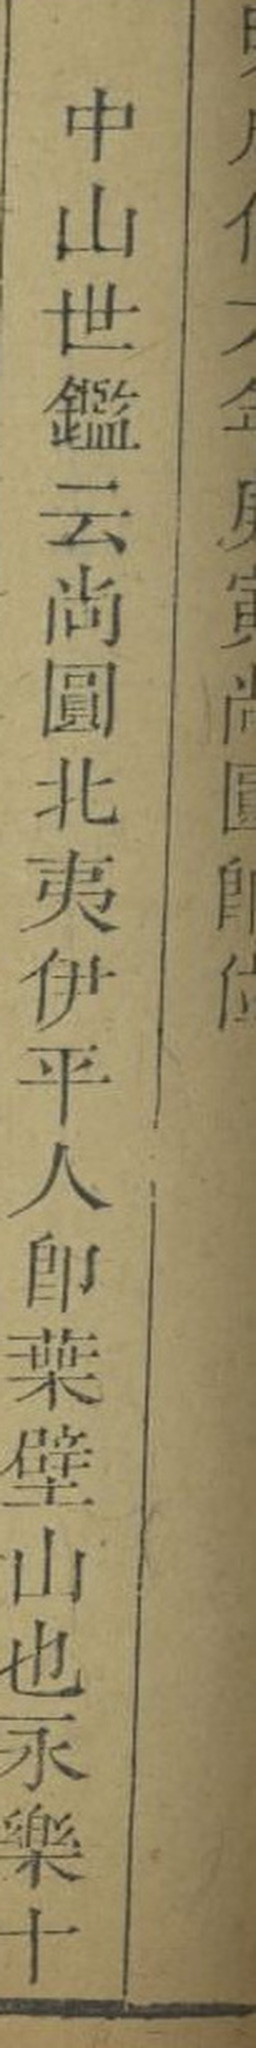中山世鑑云尚円北夷伊平人即葉壁山也永楽十
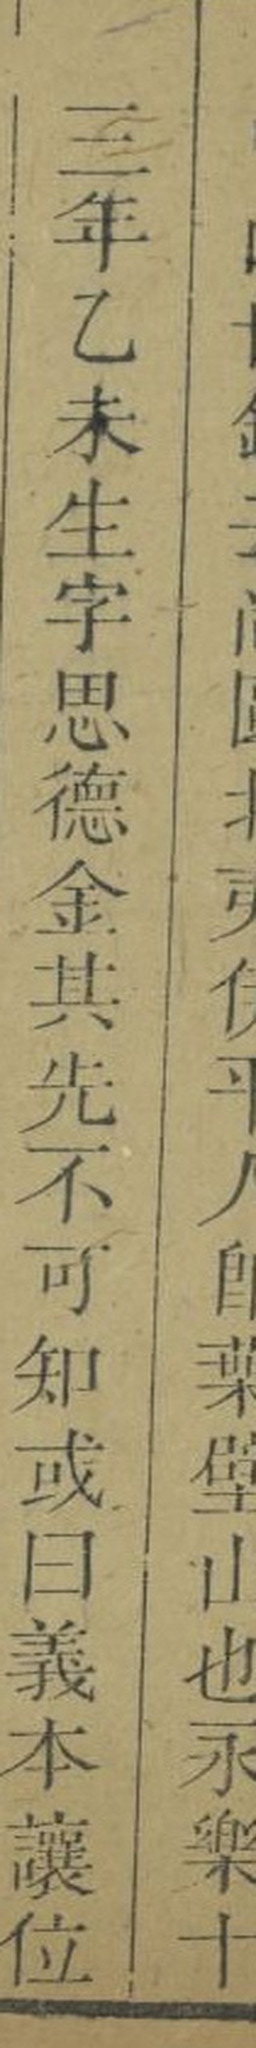三年乙未生字思徳金其先不可知或曰義本譲位
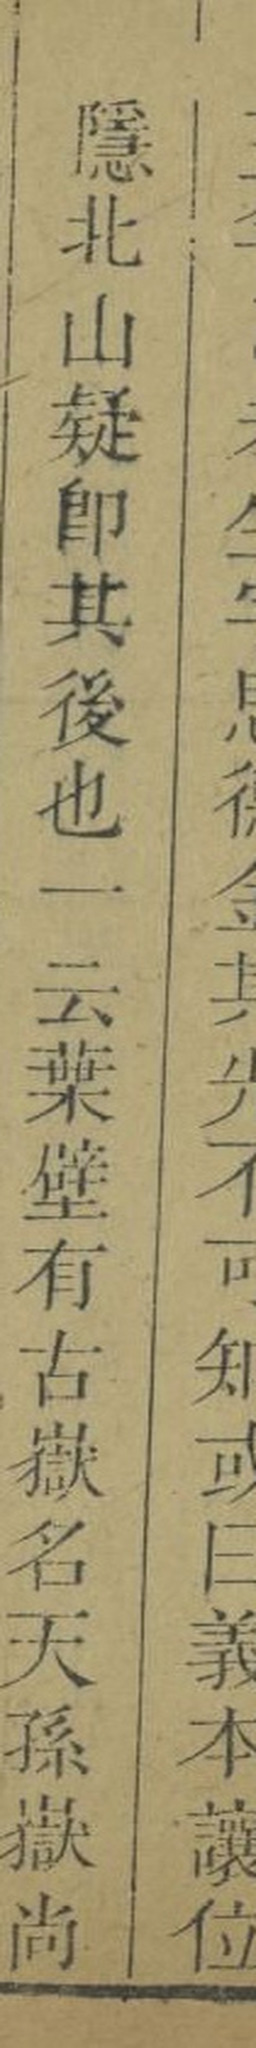隠北山疑即其後也一云葉壁有古岳名天孫岳尚
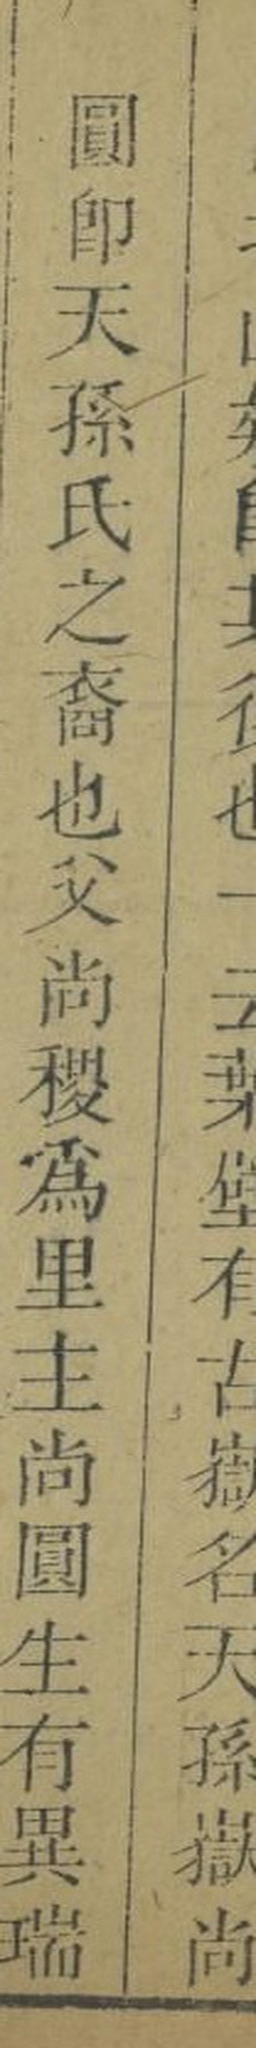円即天孫氏之裔也父尚稷為里主尚円生有異瑞
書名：中山伝信録 巻三
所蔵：University of the Ryukyus Library
